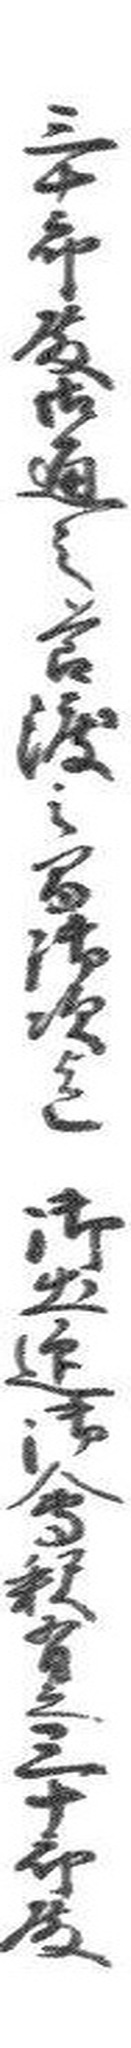三十郎殿御通之節渡之間御次迄御出迎御会釈有之三十郎殿
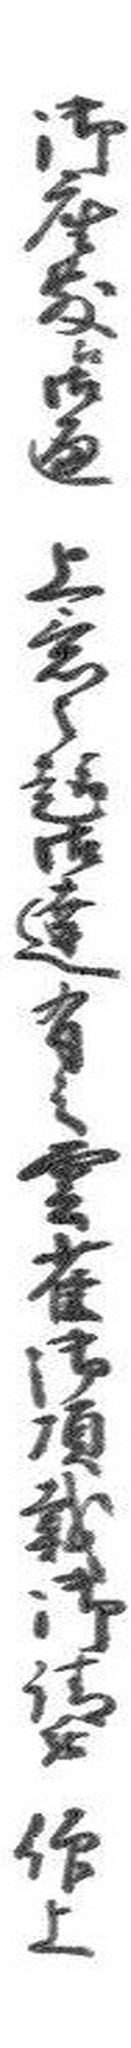御座敷江御通上意之趣御達有之雲雀御頂戴御請被仰上
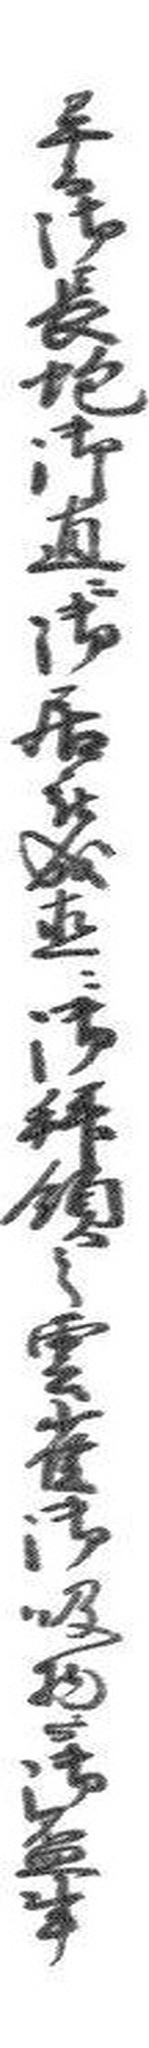畢而御長蚫御直ニ御居被成直ニ御拝領之雲雀御吸物ニ而御盃事
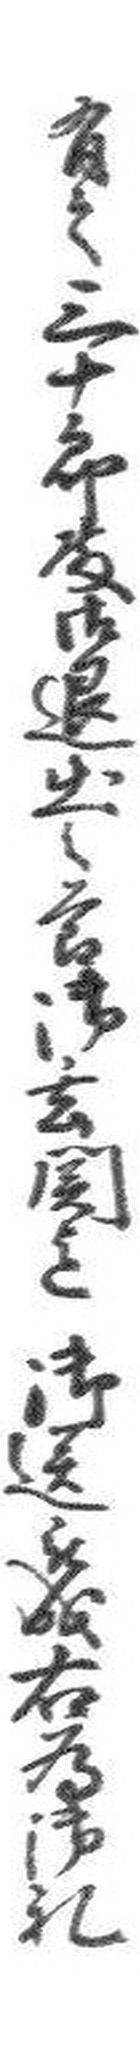有之三十郎殿御退出之節御玄関迄御送被成右為御礼
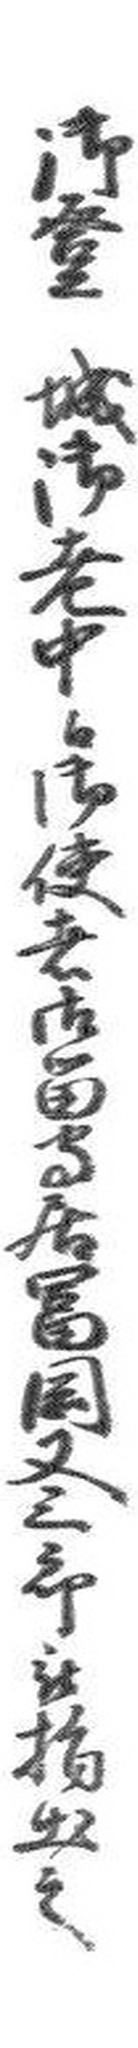御登城御老中江御使者御留守居冨岡又三郎被指出之
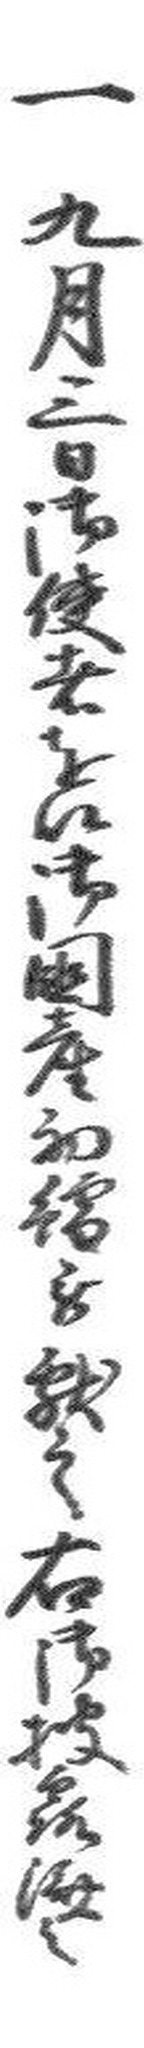一九月三日御使者を以御国産初鱈被献之右御披露済之

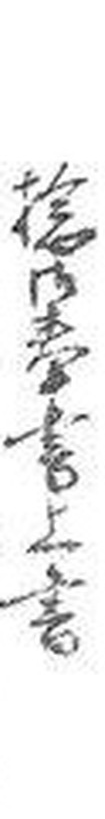捻御奉書上書
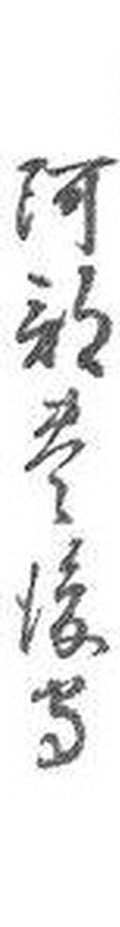阿部豊後守
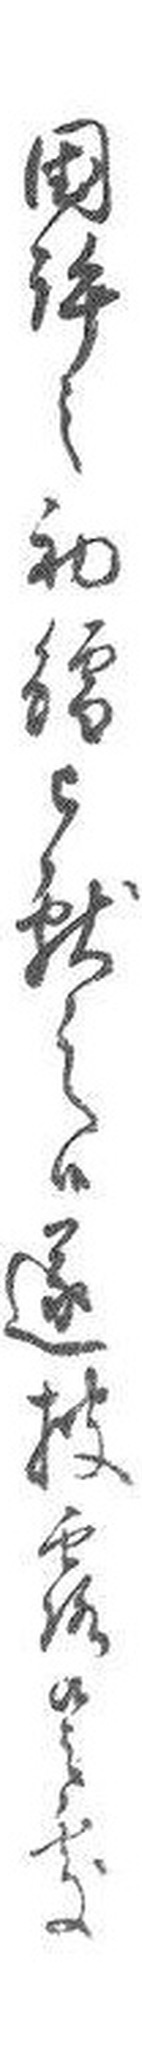国許之初鱈被献之候遂披露候之処
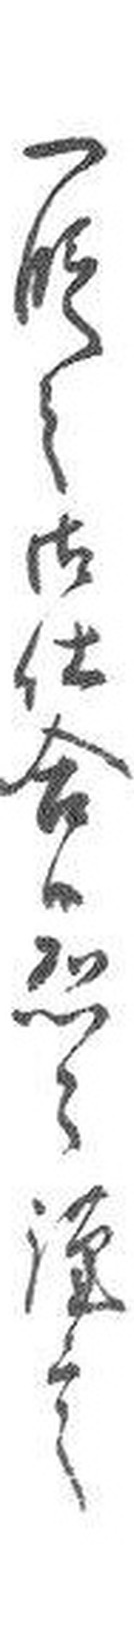一段之御仕合候恐々謹言
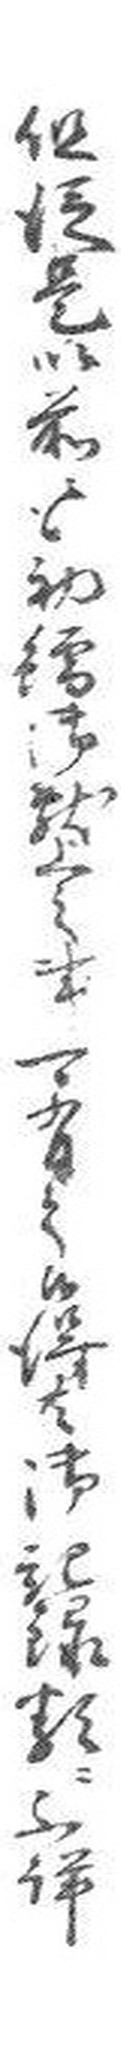但従是以前ニも初鱈御献上之事可有之候得共御記録類ニ不詳
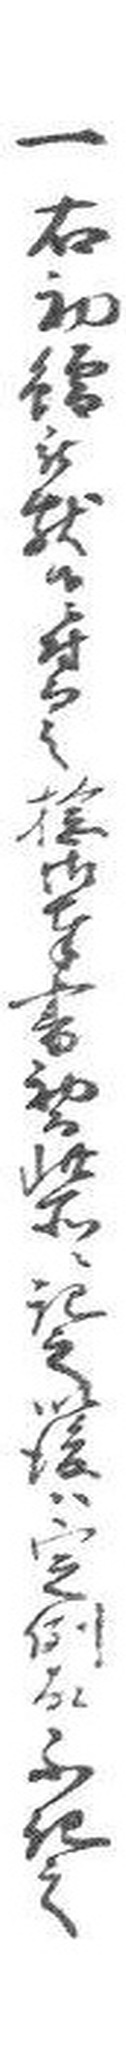一右初鱈被献候ニ付而之捻御奉書初而此所ニ記之以後は定例故不記之
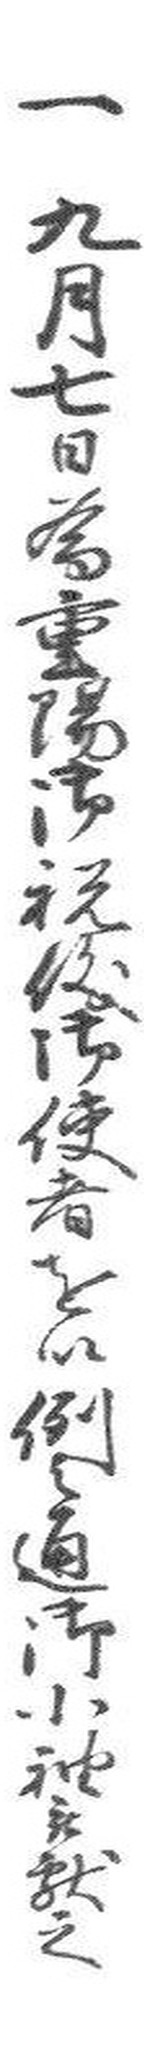一九月七日為重陽御祝儀御使者を以例之通御小袖被献之
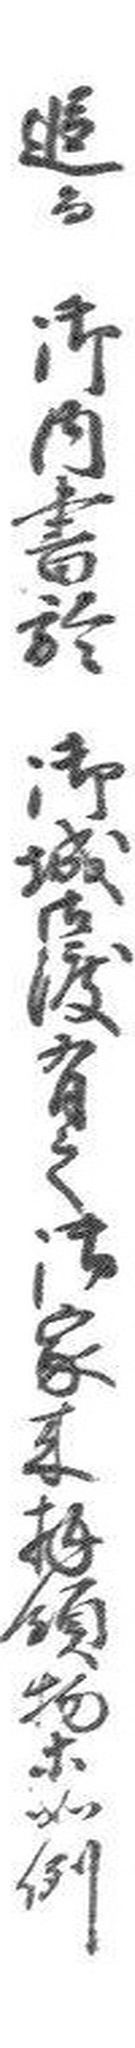追而御内書於御城御渡有之御家来拝領物等如例
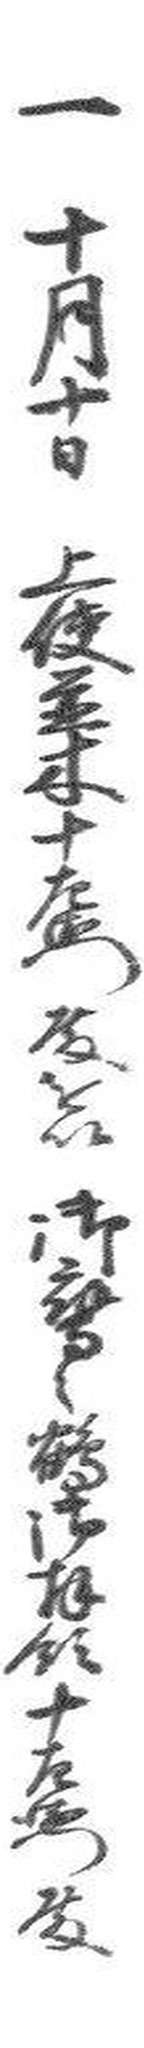一十月十日上使並木十左衛門殿を以御鷹之鶴御拝領十左衛門殿
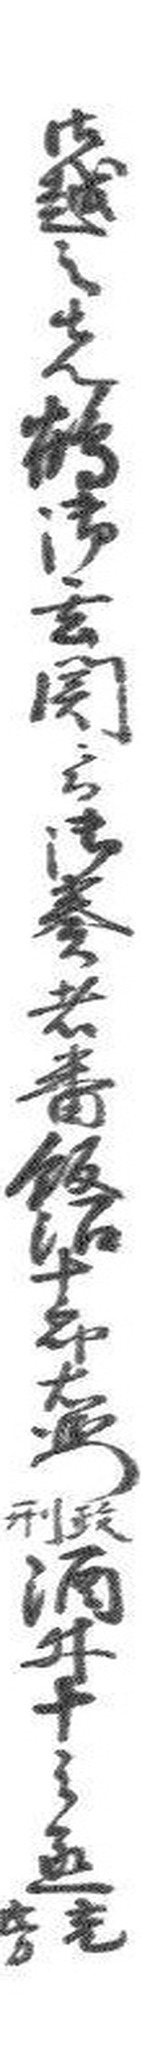御越之先鶴御玄関ニ而御奏者番飯沼十郎右衛門政刑酒井十之丞充房
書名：家譜 六 光通公 従万治三年到寛文三年
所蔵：福井県文書館 Fukui Prefectural Archives
